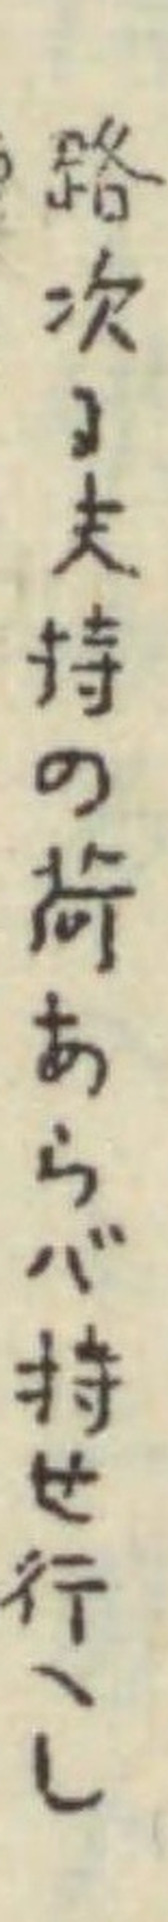路次に夫持之荷あらバ持せ行へし
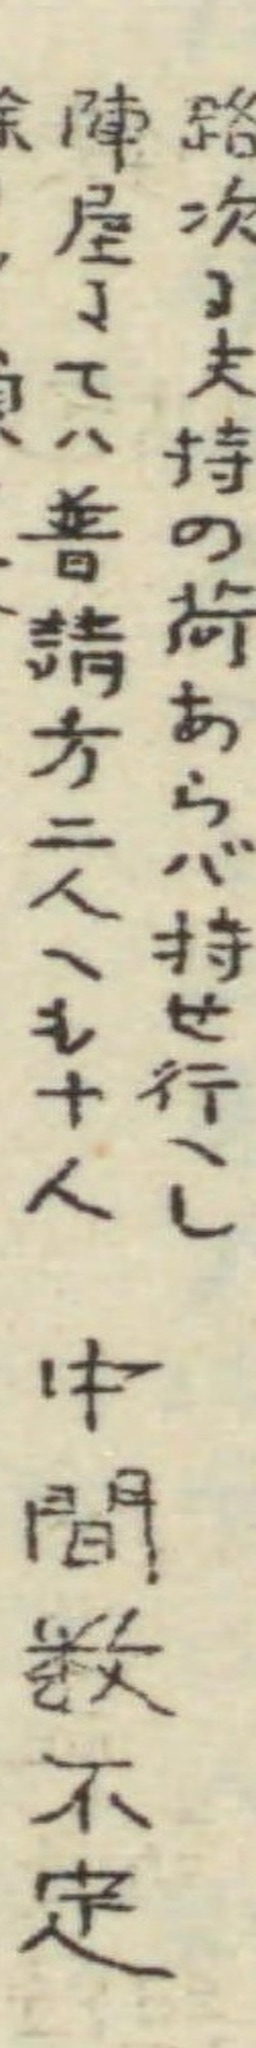陣屋にてハ普請方二人へも十人中間数不足
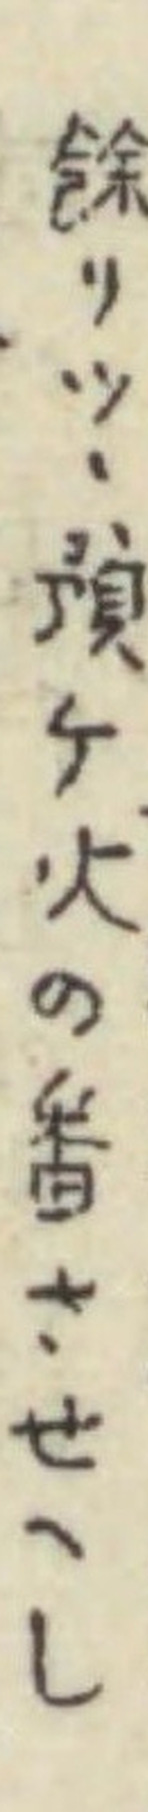餘るツゝ預ヶ火の番させへし
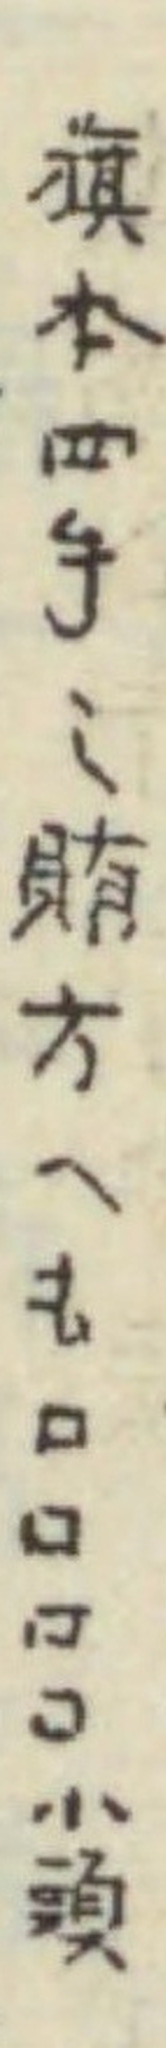旗本四手之賄方へも口口口口小頭
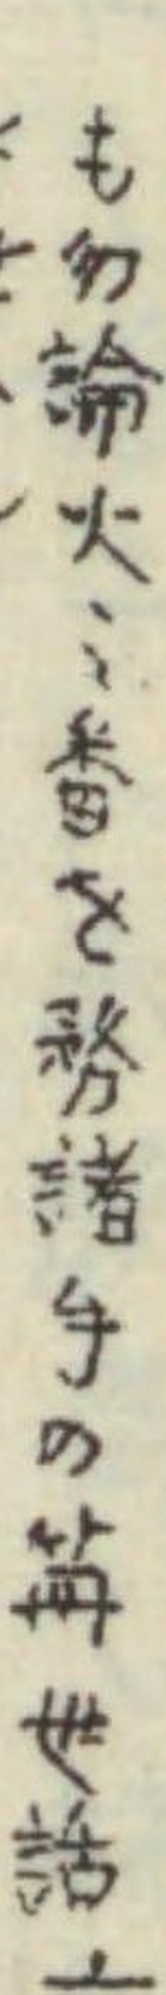も勿論火之番を務諸手の笧世話庄屋
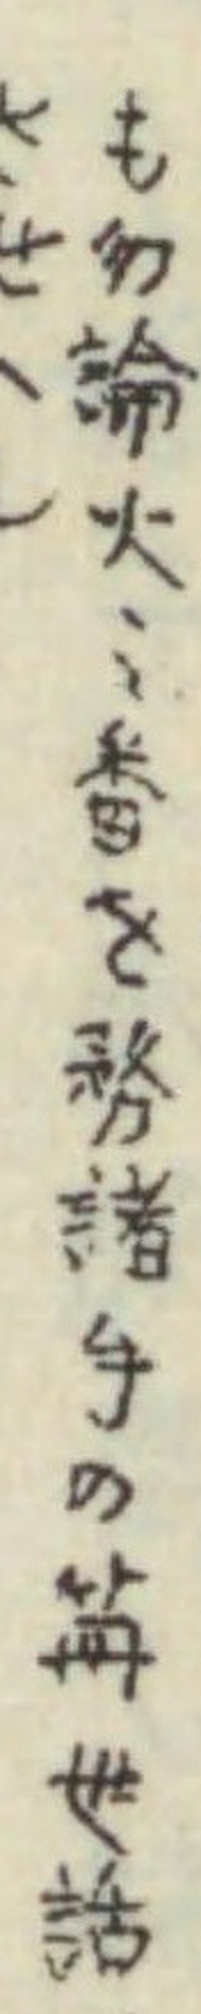も勿論火之番を務諸手の笧世話庄屋
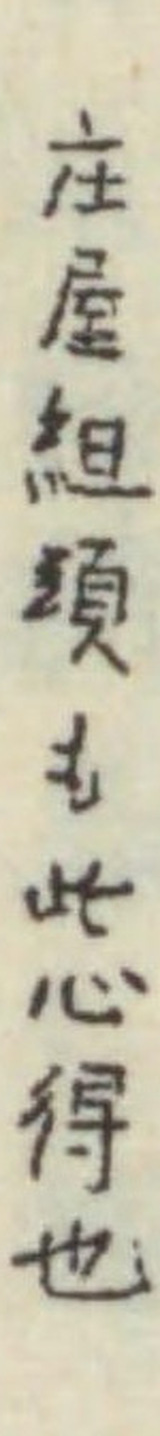庄屋組頭も此心得也
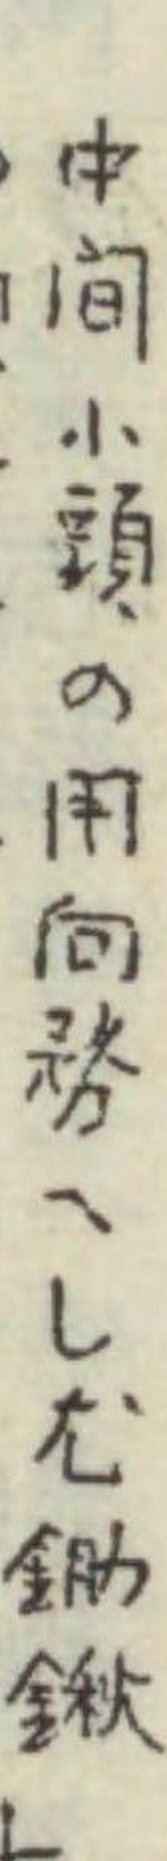中間小頭の用向勤へし尤鋤鍬
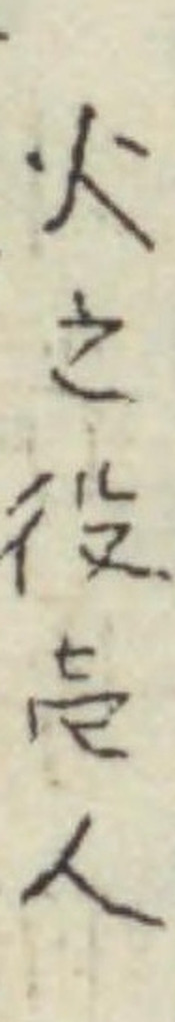火之役壱人
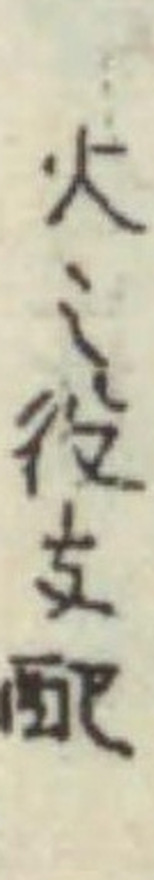火之役支配
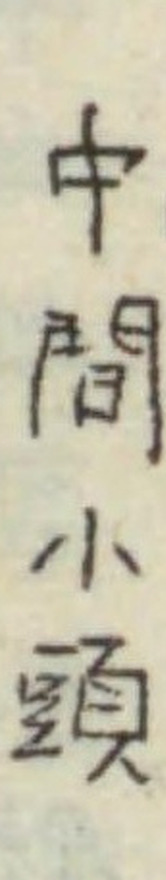中間小頭
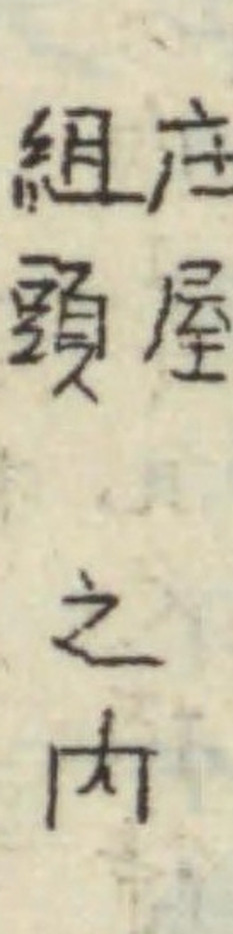組頭之内
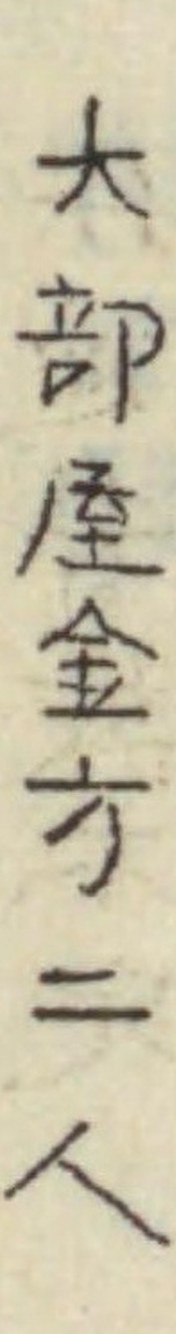大部屋金方二人
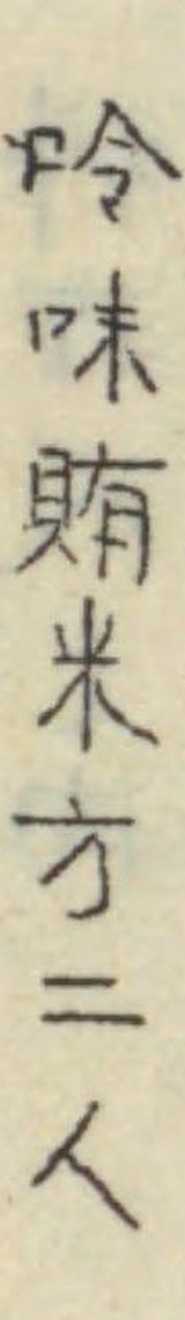吟味賄米方二人
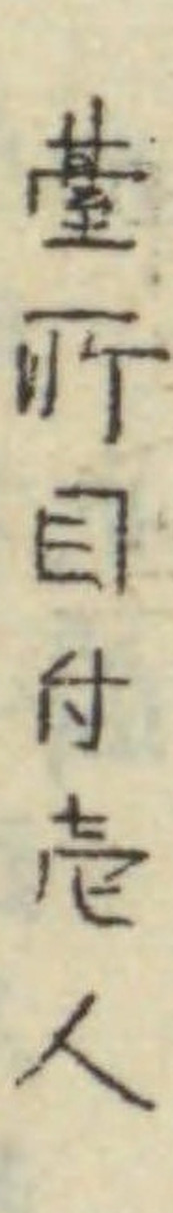台所目付壱人

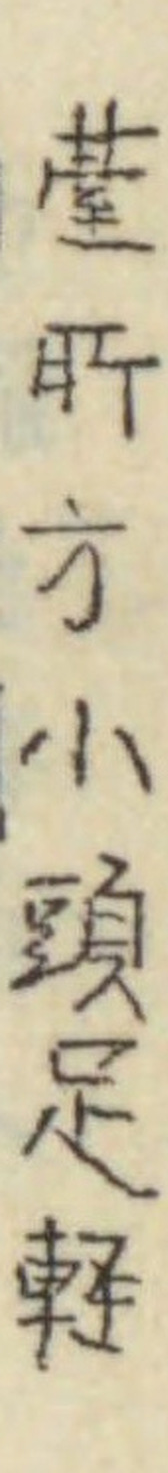台所方小頭足軽
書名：三河吉田藩動員史料
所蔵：国立国会図書館 National Diet Library, JAPAN
